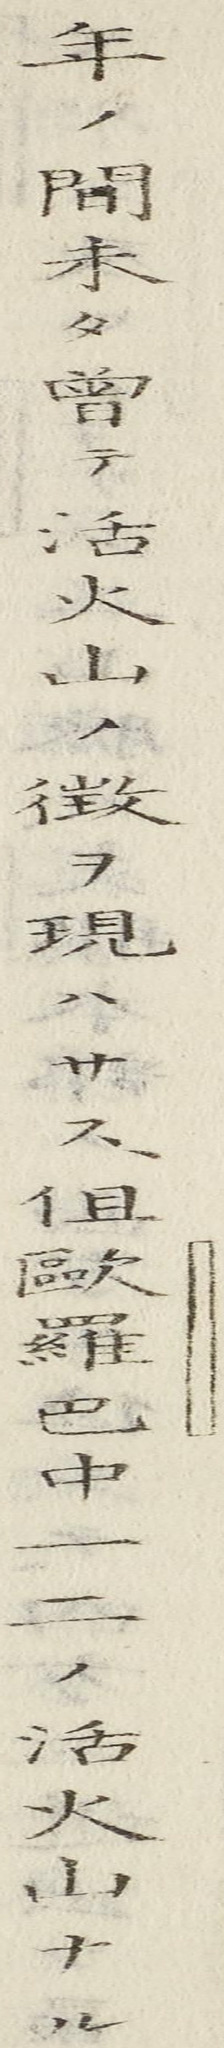年ノ間未タ曾テ活火山ノ徴ヲ現ハサス、但欧羅巴中一二ノ活火山ナル
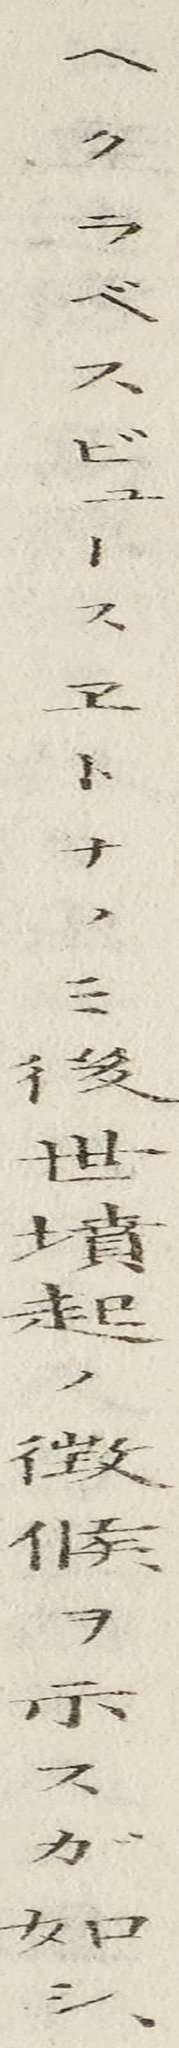ヘクラベスビュースエトナノミ後世墳起ノ徴候ヲ示スガ如シ、
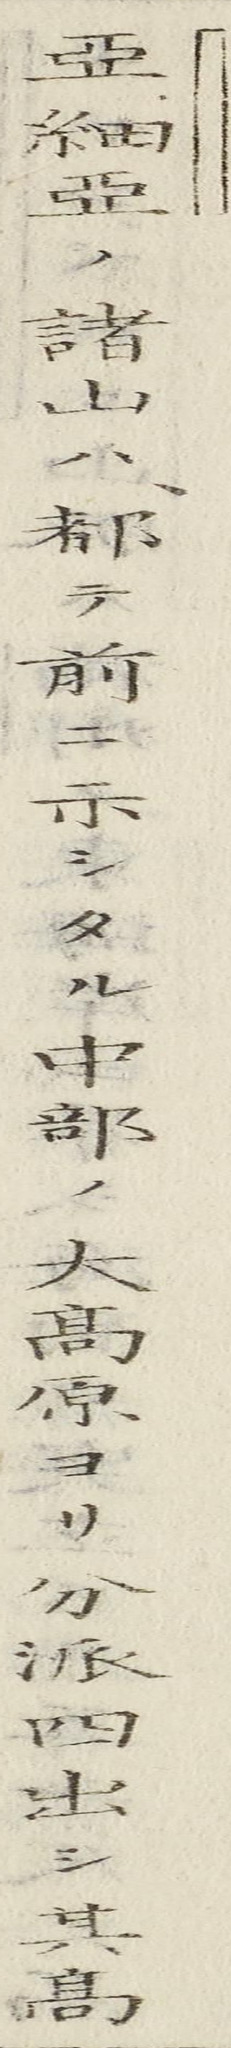亜細亜ノ諸山ハ、都テ前ニ示シタル中部ノ大高原ヨリ分派四出シ其高
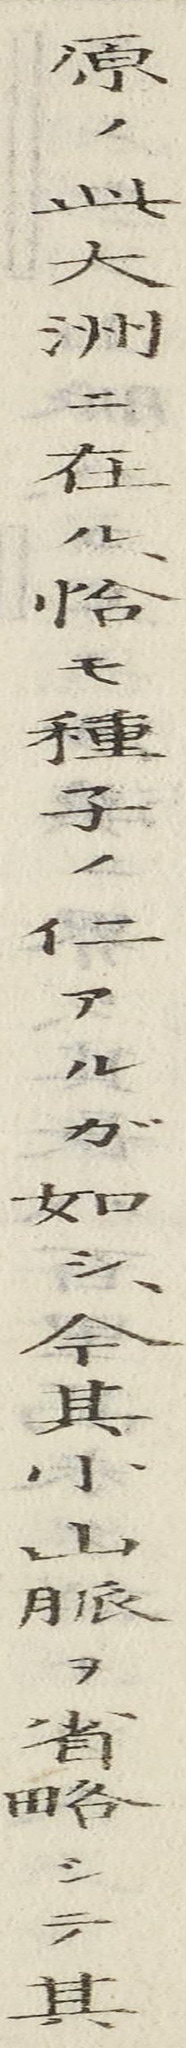原ノ此大洲ニ在ル、恰モ種子ノ仁アルガ如シ、今其小山脈ヲ省略シテ其
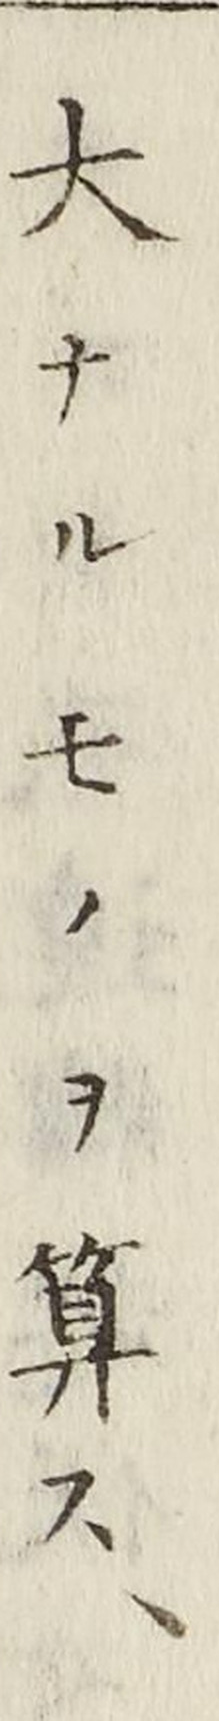大ナルモノヲ算出ス、
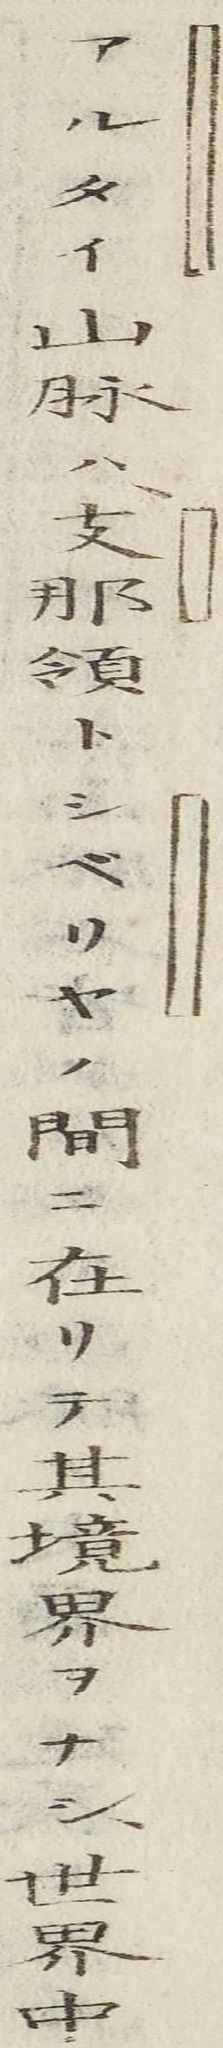アルタイ山脈ハ、支那トシベリヤノ間ニ在リテ其境界ヲナシ、世界中
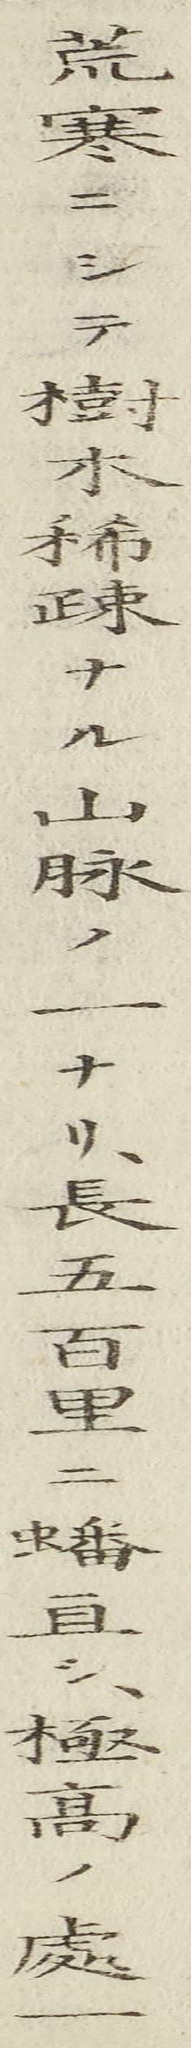荒寒ニシテ樹木稀疎ナル山脈ノ一ナリ、長五百里ニ蹯亘シ、極高ノ処一

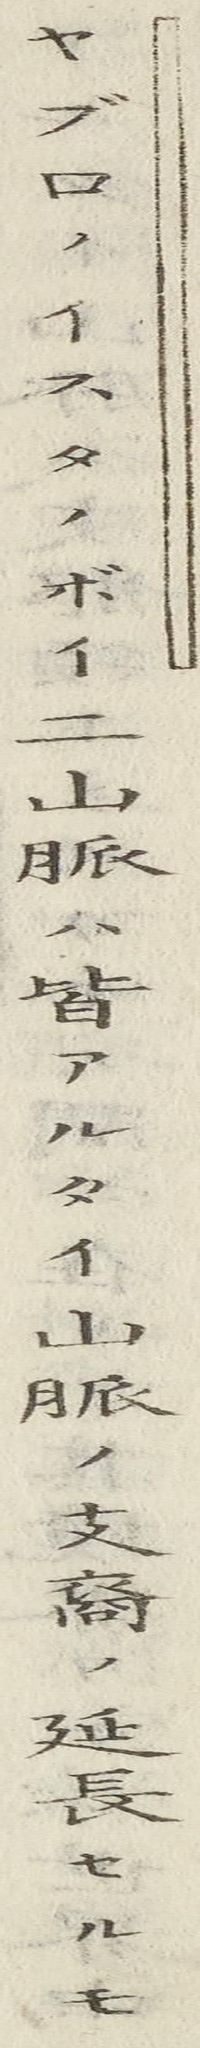ヤブロノイフ、タノボイニ山脈ハ皆アルタイ山脈ノ支裔ノ延長セルモ
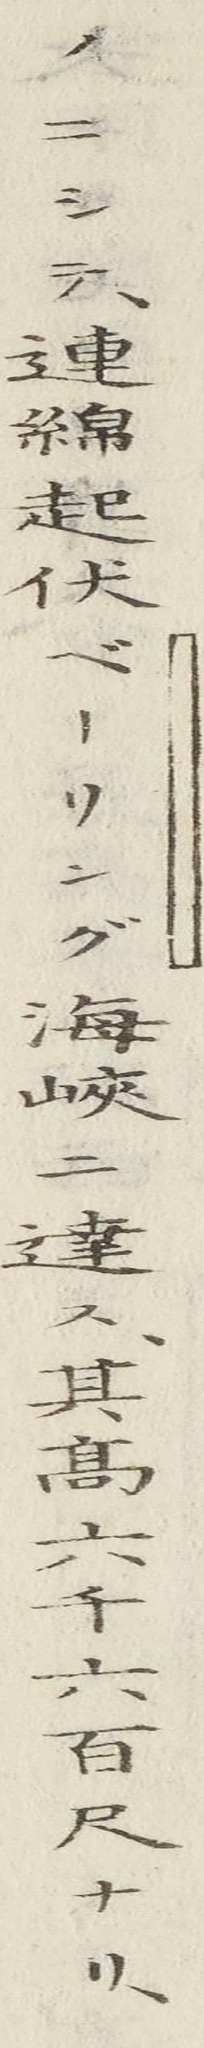ノニシテ、連綿起伏ベーリング海峡ニ達ス、其高六千六百尺ナリ、
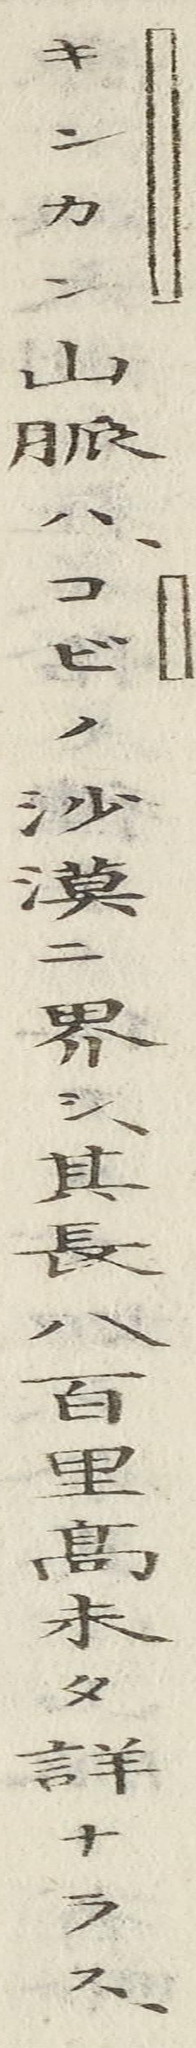キンカン山脈ハ、コビノ沙漠ニ界シ、其長八百里高未タ詳ナラス、
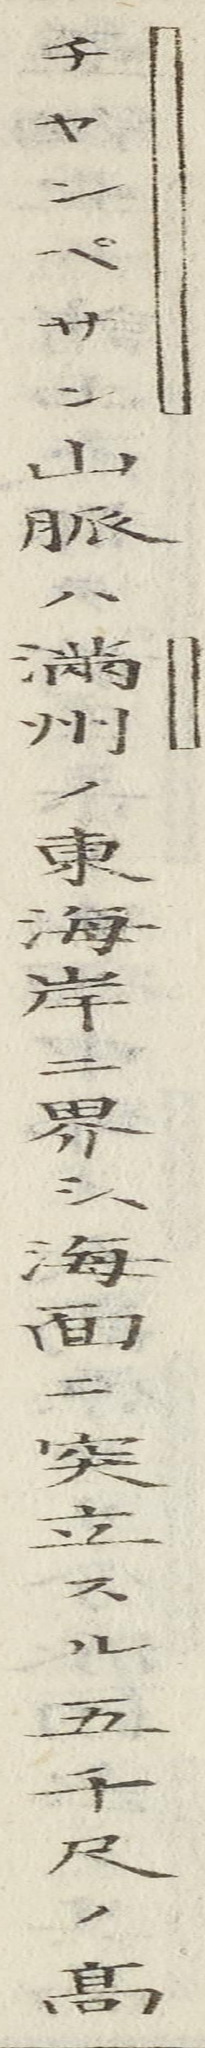チャンペサン山脈ハ満洲ノ東海岸ニ界シ、海面ニ突立スル五千尺ノ高
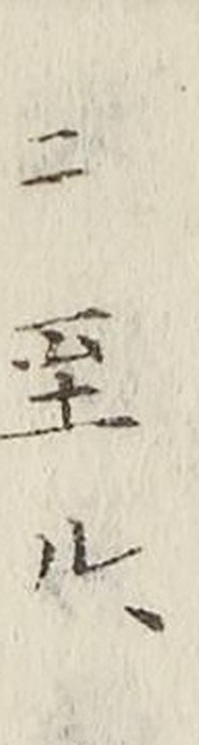ニ至ル、
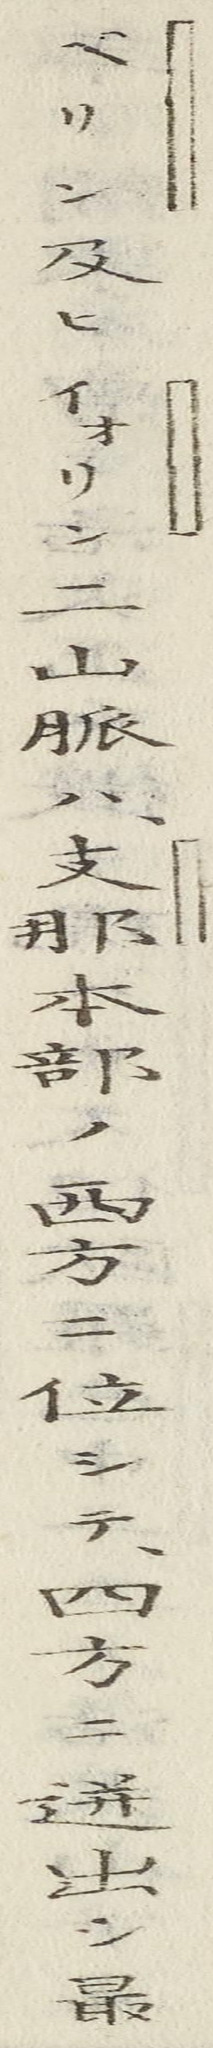ベリン及ヒイォリン二山脈ハ、支那本部ノ西方ニ位シテ、四方ニ迸出シ最
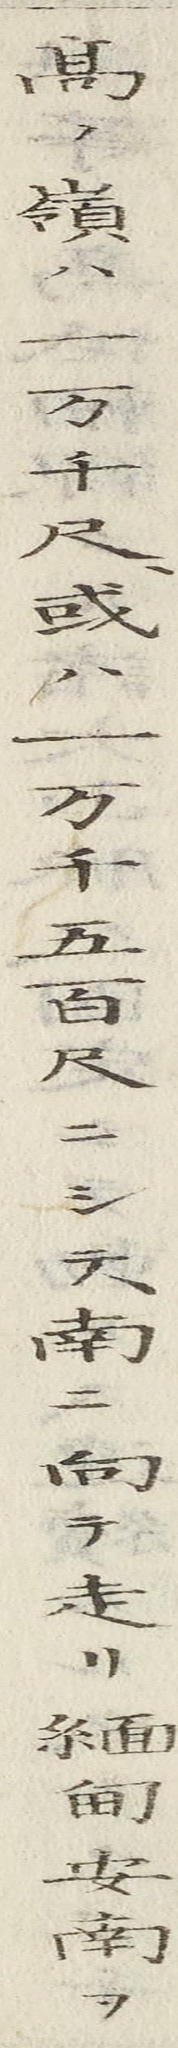高ノ嶺ハ一万千尺、或ハ一万千五百尺ニシテ、南ニ向テ走リ緬甸安南ヲ
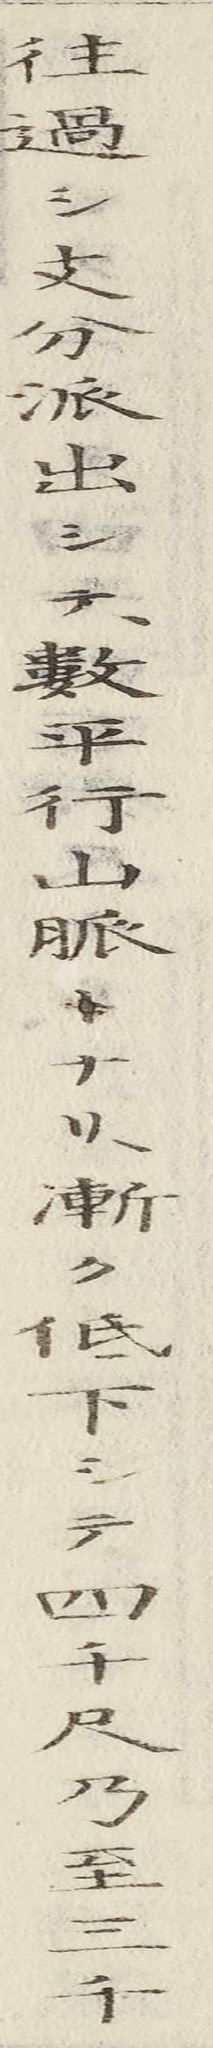往過シ支分派出シテ、数平行山脈トナリ、漸ク低下シテ四千尺乃至三千
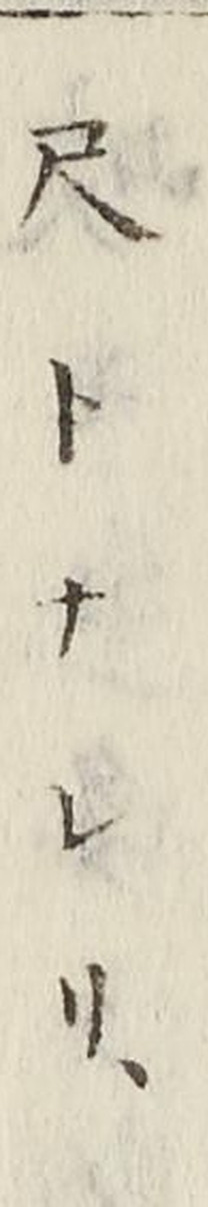尺トナレリ、
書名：百科全書　地文學　全
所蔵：東京大学地震研究所図書室 Earthquake Research Institute Library, The University of Tokyo, JAPAN
